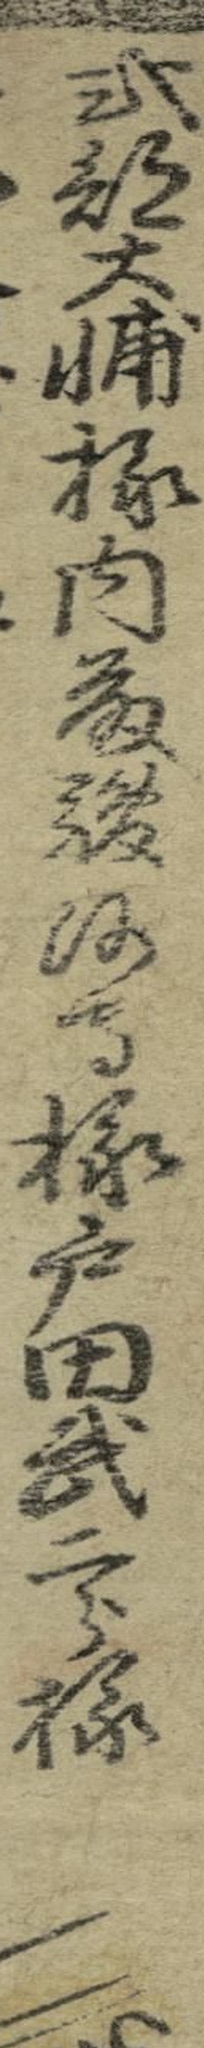式部大輔様内藤駿河守様戸田武二郎様
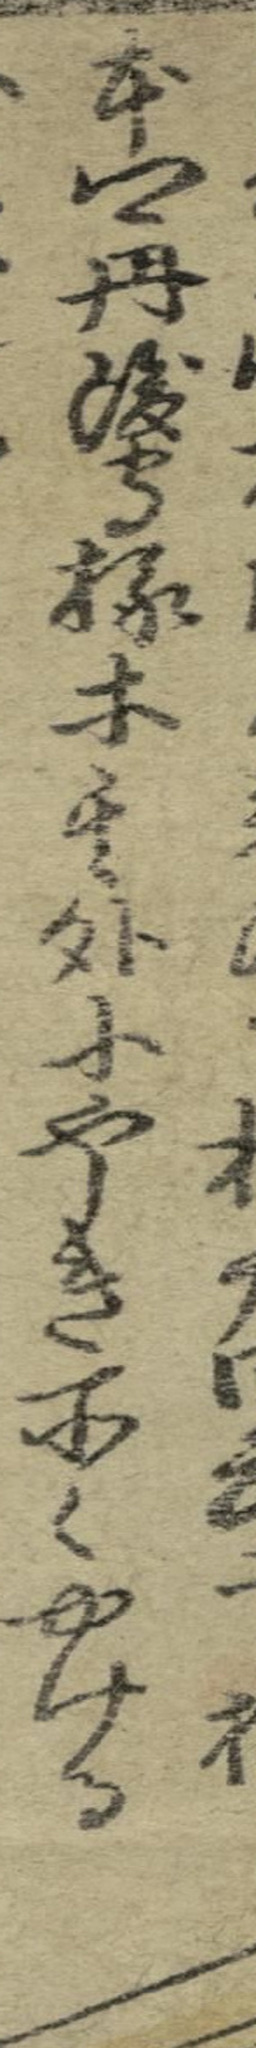本郷丹波守様等其外やしき所々やける
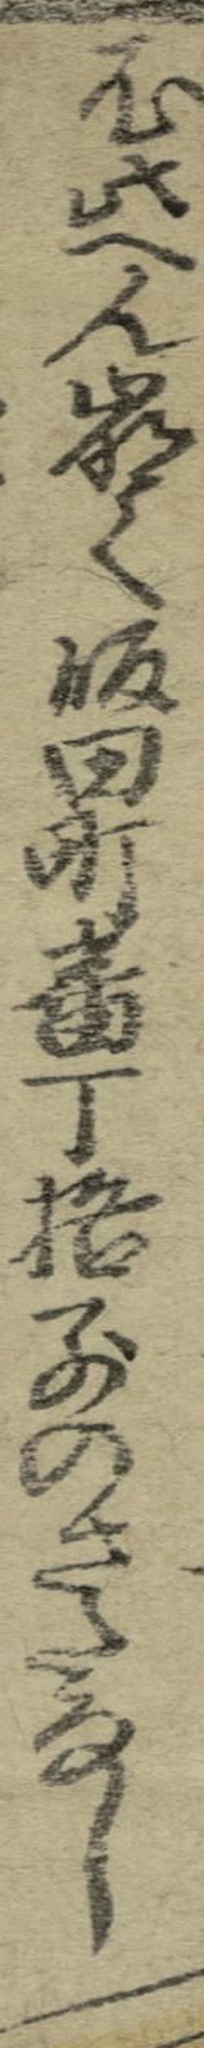尤此へん崩て飯田町番町格別のさたなし
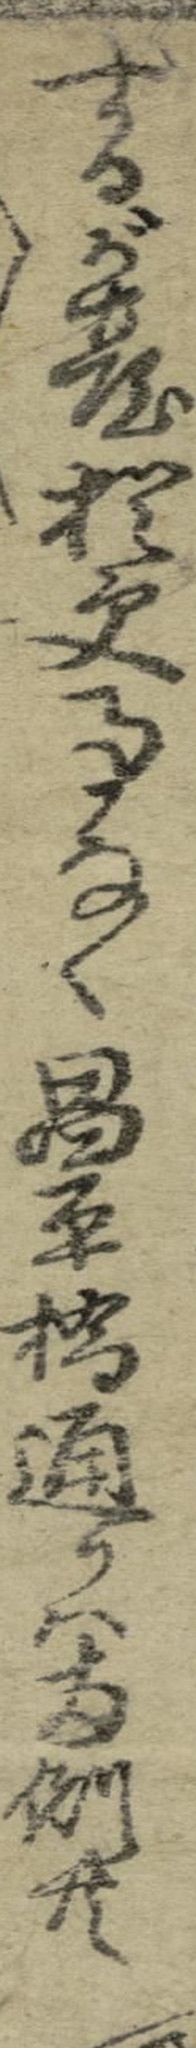するが台猶更事なく昌平橋通りは両側共
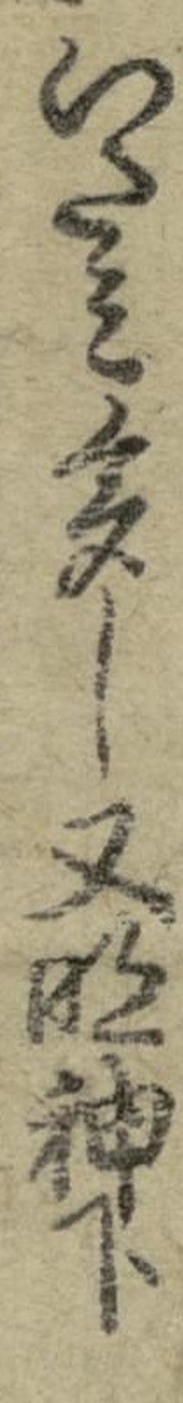いたみ多し又明神下
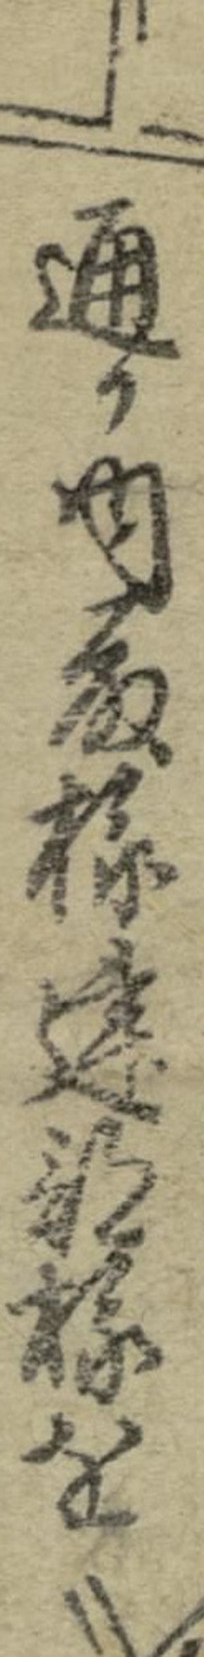通り内藤様建部様を
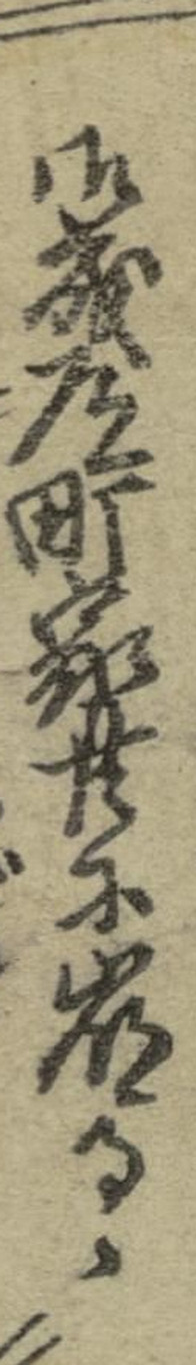塔中御成道町家共に崩るゝ
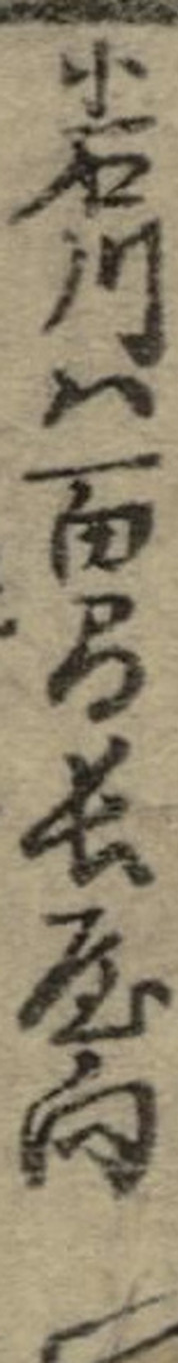小石川は百間長屋向
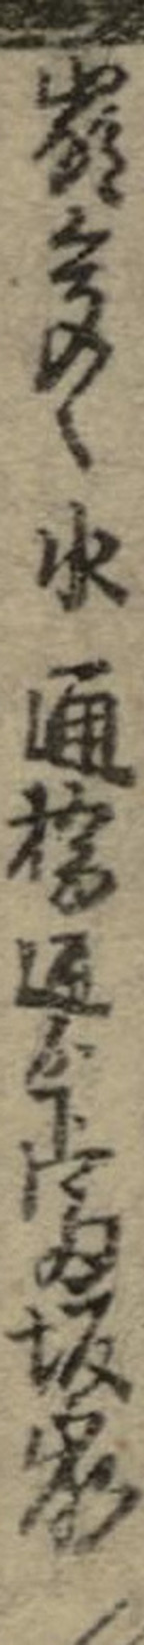崩多く水道橋通ゟ下富坂崩
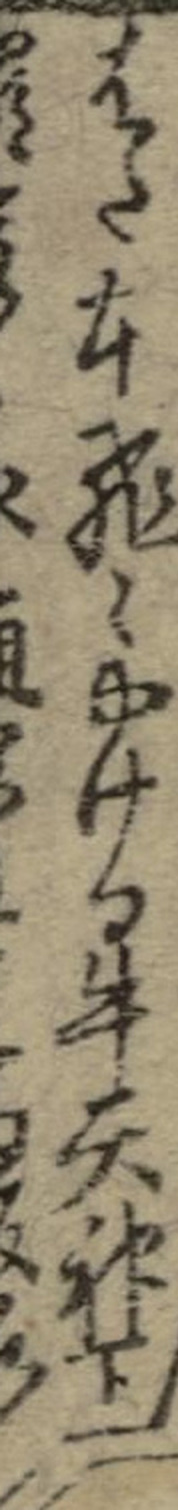はた本蔵々やける牛天神下
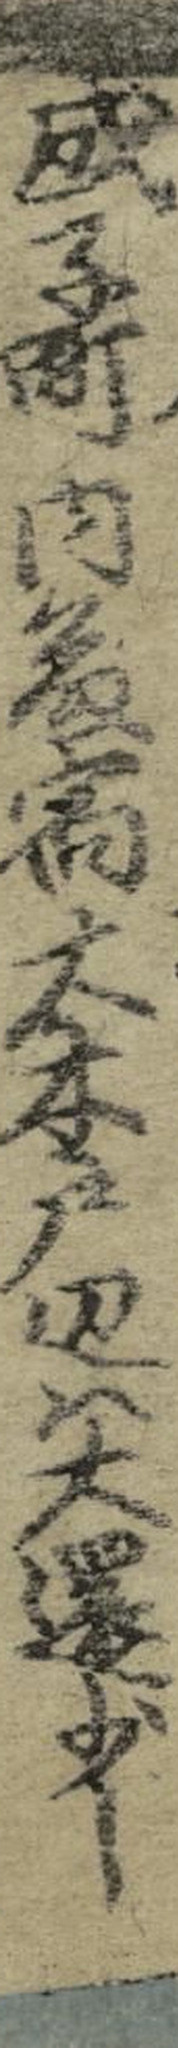成子町内藤宿大木戸辺は大還少し
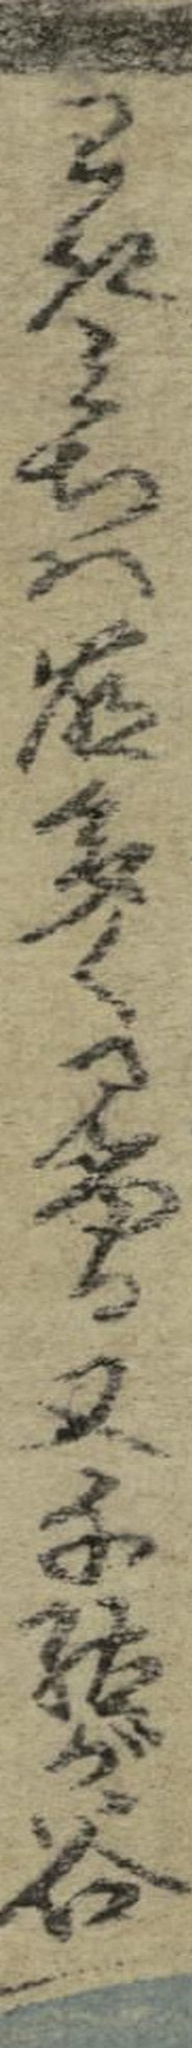わきみちは崩多く見ゆる又千駄が谷
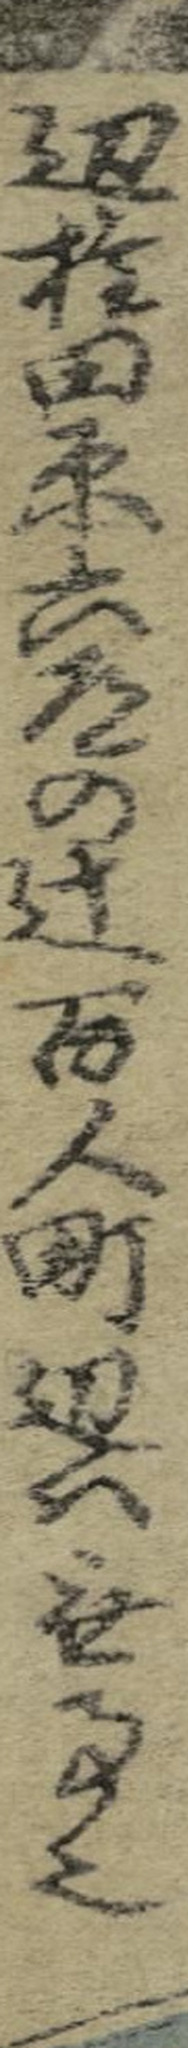辺権田原六郷の辻百人町辺は無事也
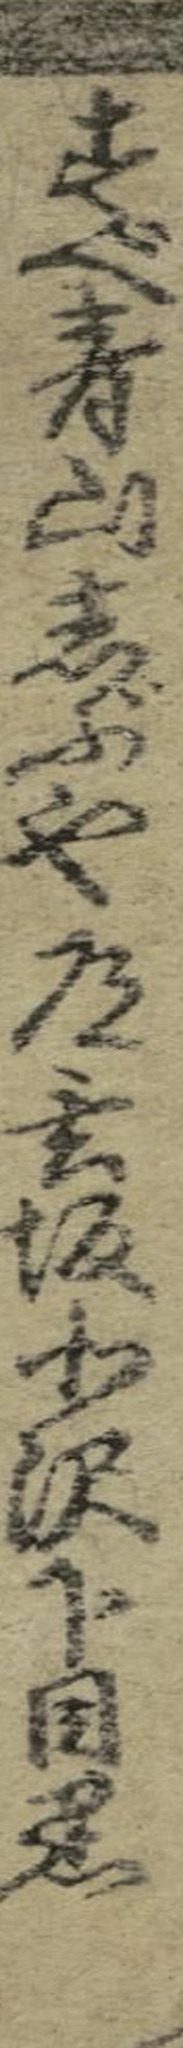すべ青山しぶや道玄坂北沢下目黒
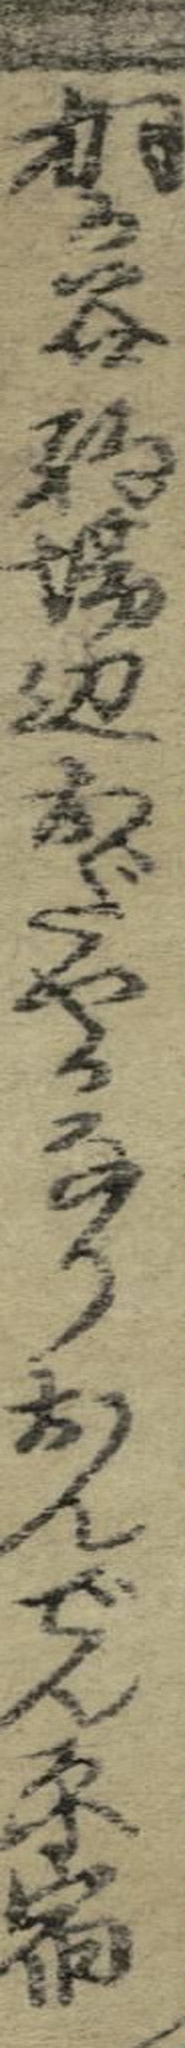桐ヶ谷駒場辺おだやかなりおんでん原宿
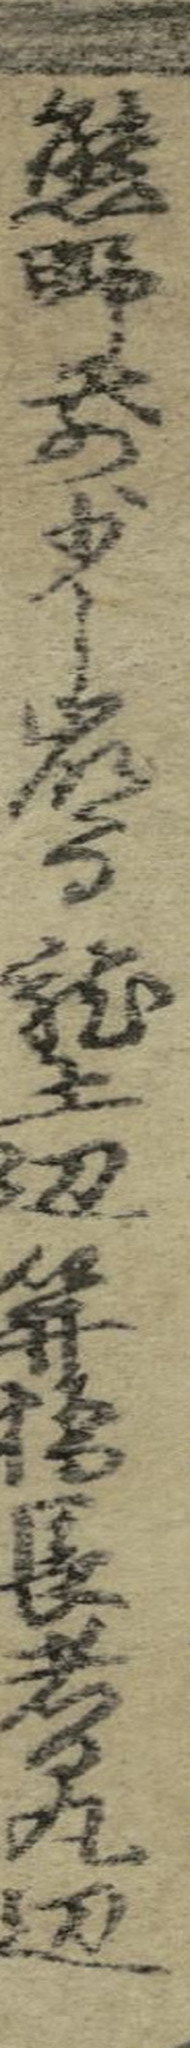熊野前少し崩る龍土辺笄橋長者か丸辺
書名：安政二卯十月二日大地震附類焼場所
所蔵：東京大学地震研究所図書室 Earthquake Research Institute Library, The University of Tokyo, JAPAN
